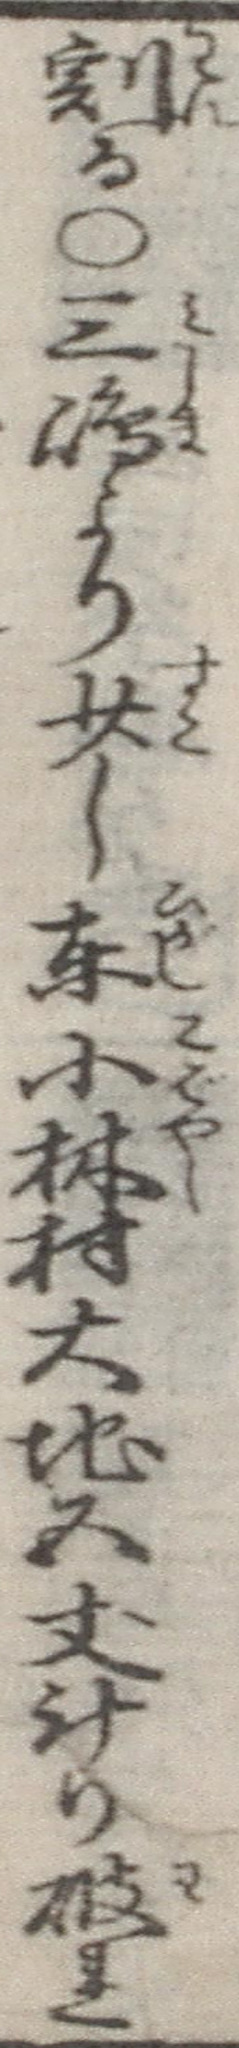割る○三嶋より少し東小林村大地五丈計り破れ
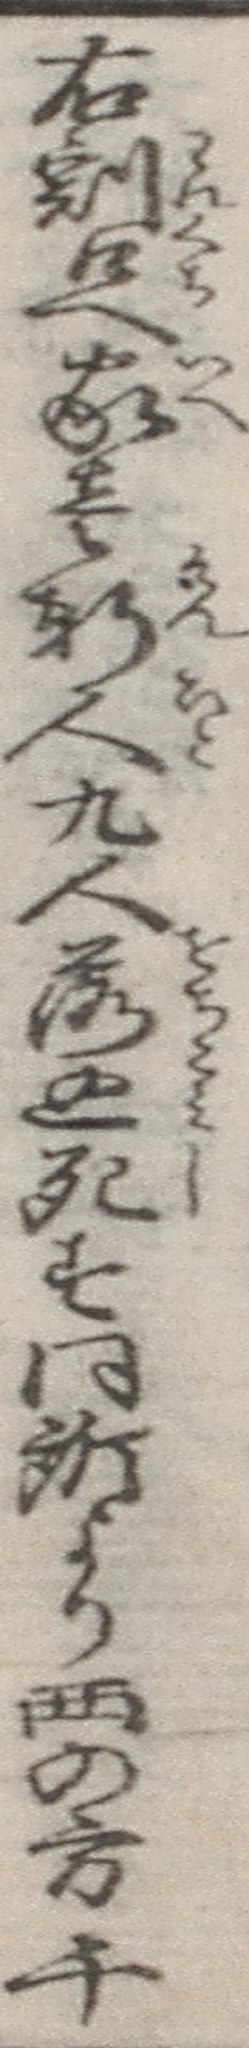右割口へ家壱軒人九人落込死す同所より西の方千
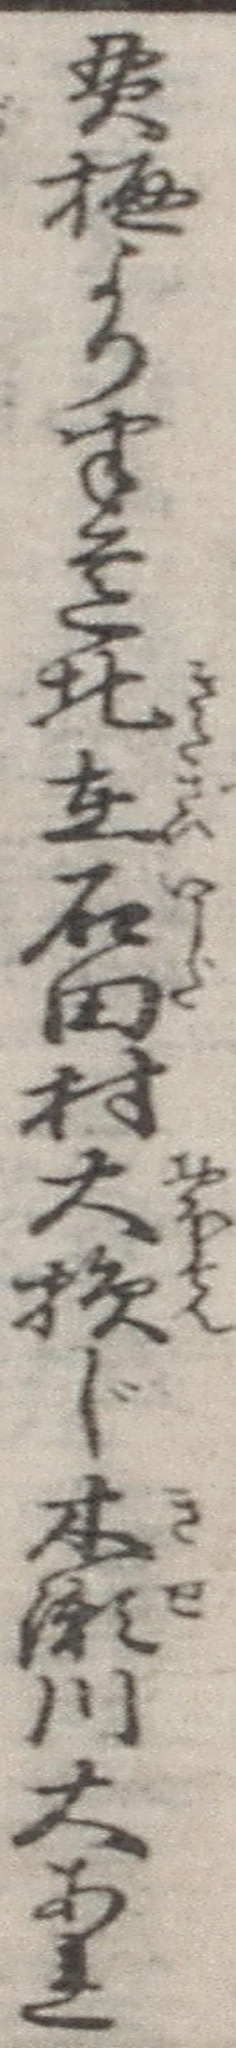貫樋より半道北在石田村大損じ木瀬川大あれ
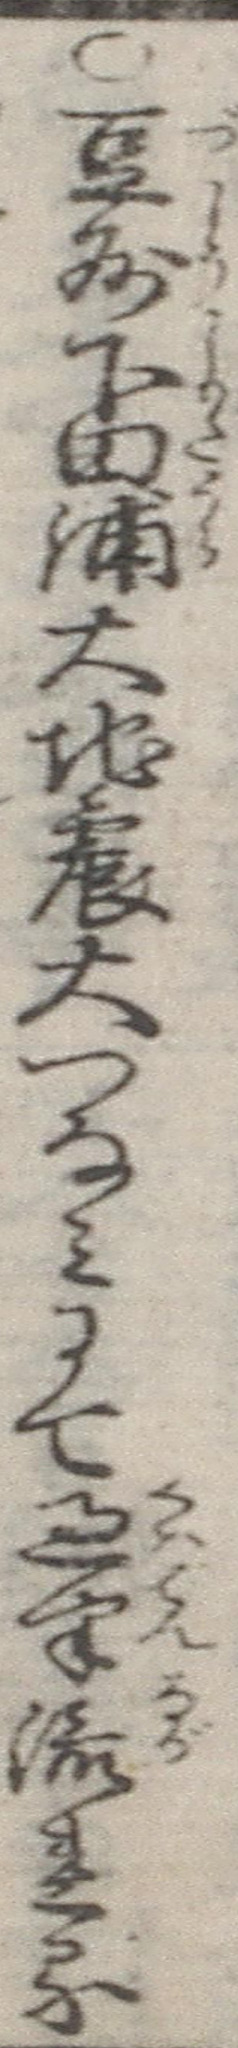○豆州下田浦大地震大つなみにて過半流れる
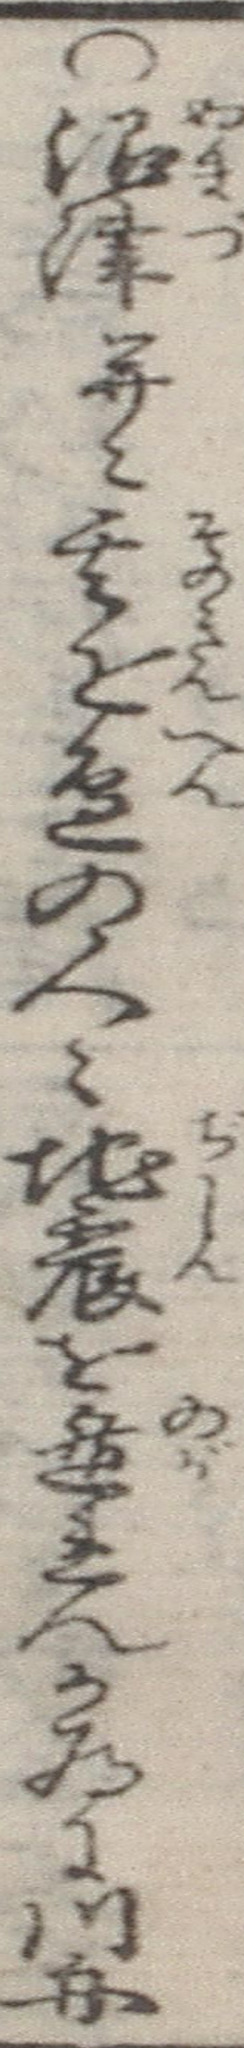○沼津并に其近辺の人々地震を逃れんが為に川舟
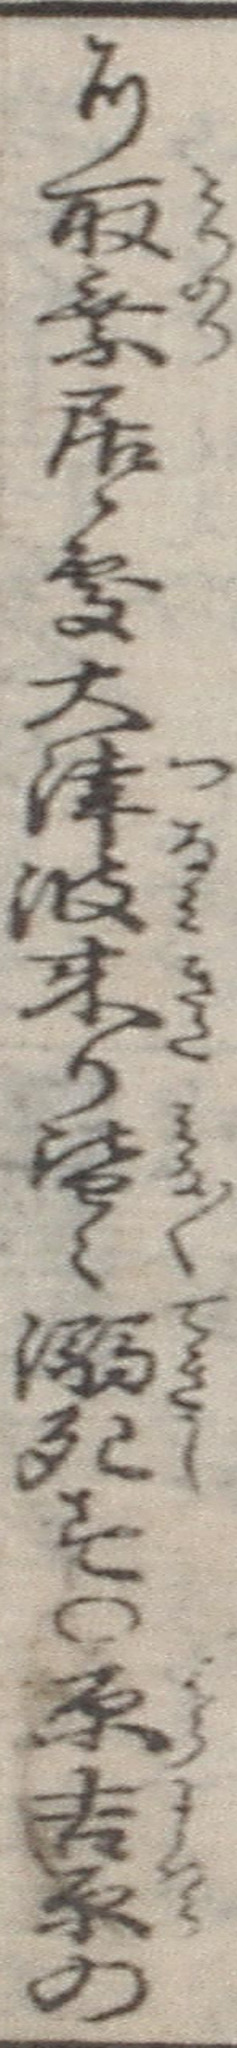に取乗居候處大津波来り皆々溺死す○原吉原の
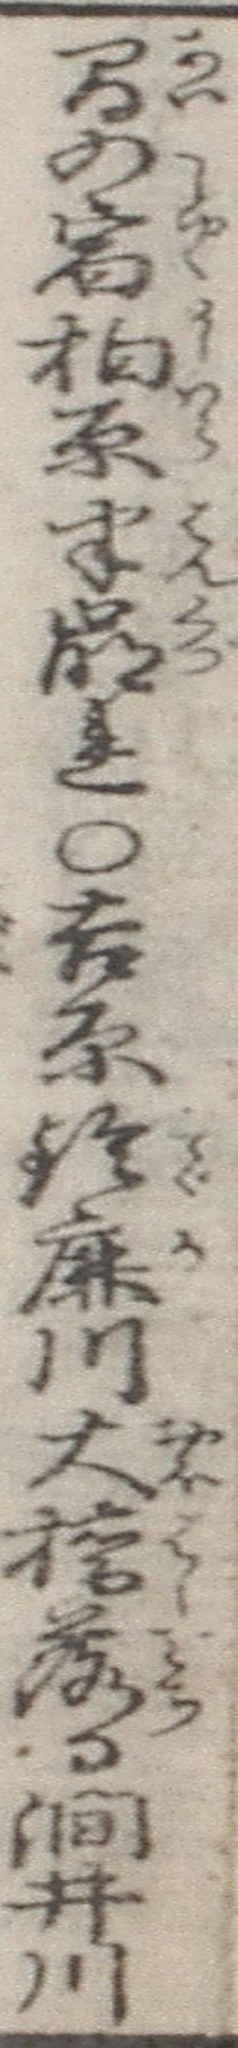間の宿柏原半崩れ○吉原鈴鹿川大橋落る澗井川
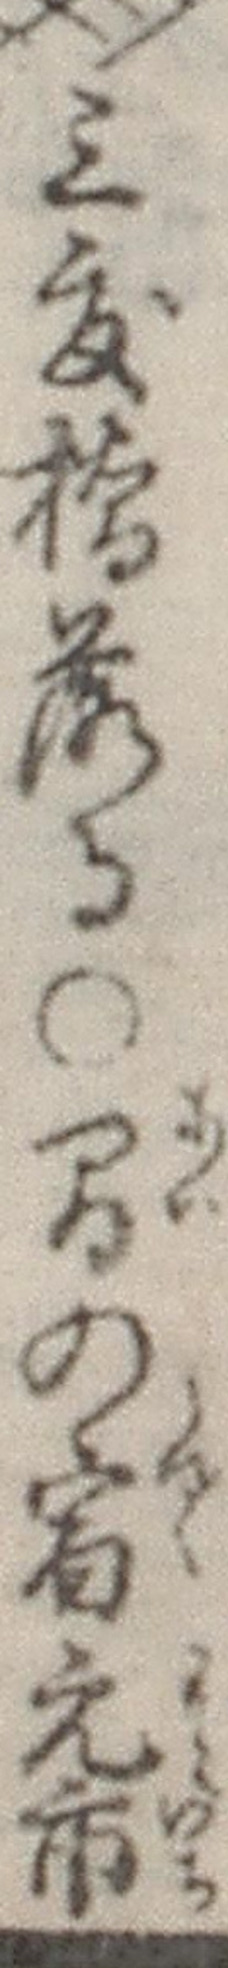三度橋落る○間の宿元市
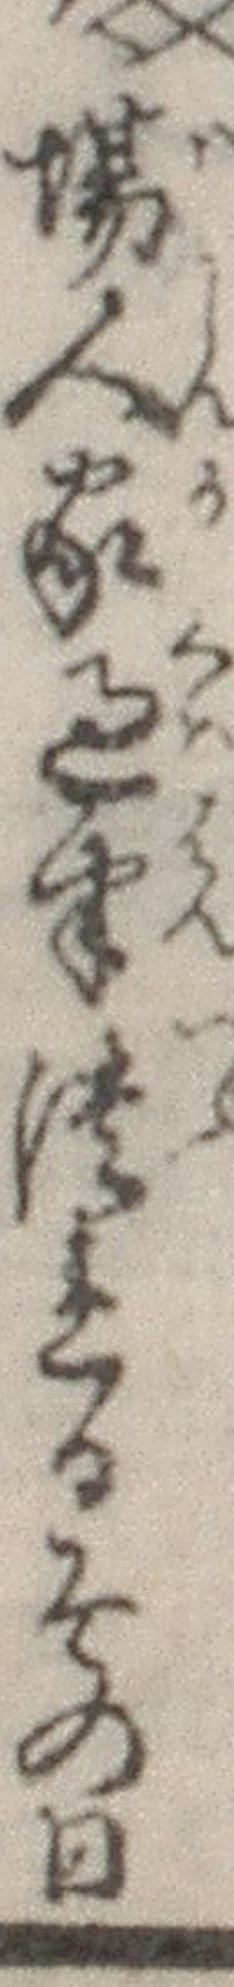場人家過半潰れるその日
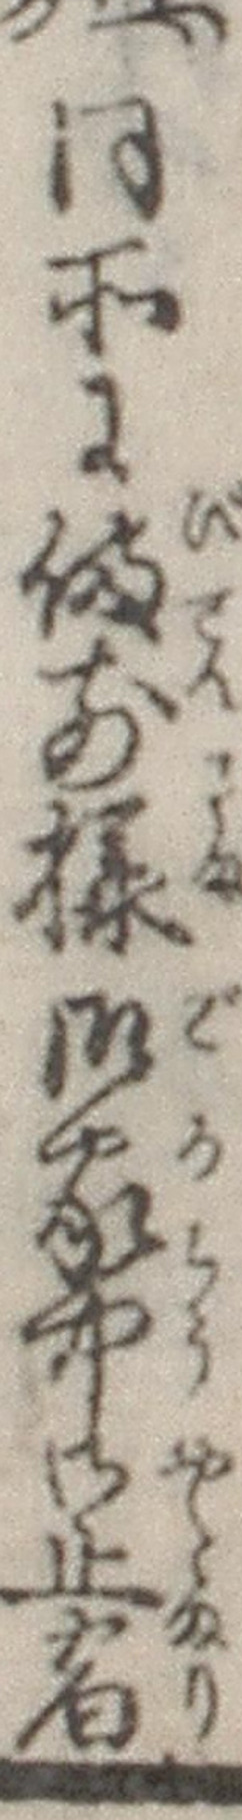同所に備前様御家中御止宿
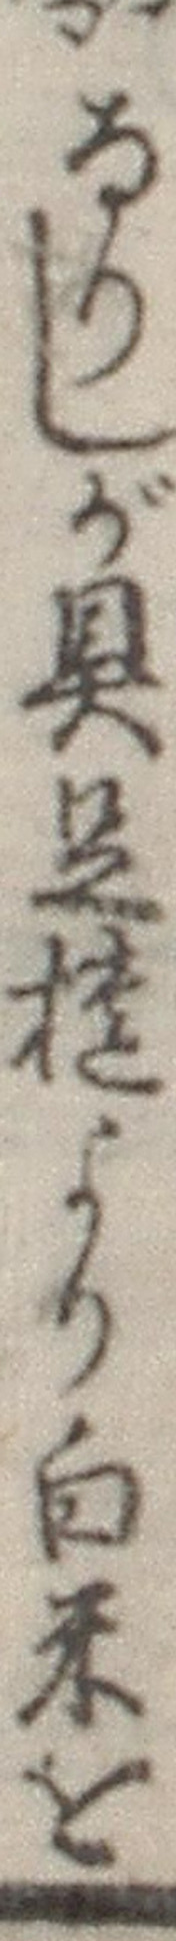なりしが具足櫃より白米を
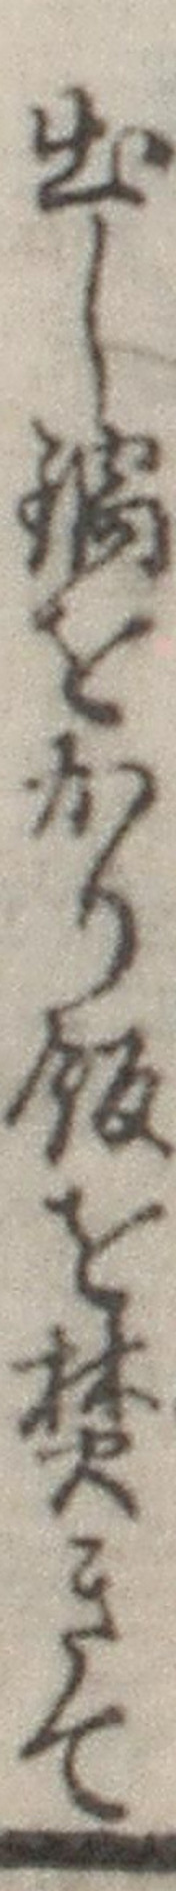出し鍋をかり飯を焚きて
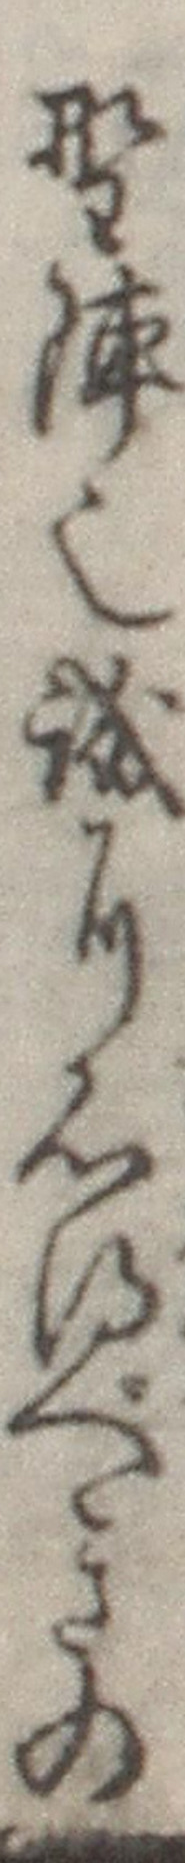野陣し誠に心得べきの
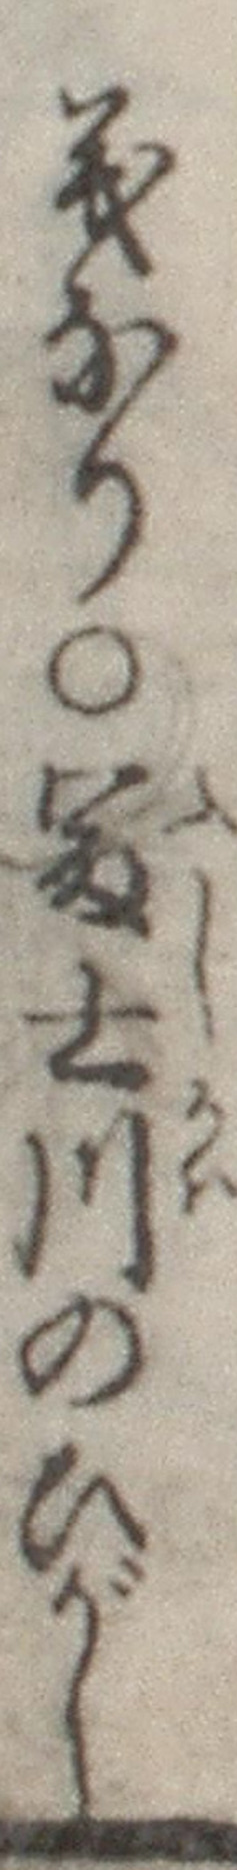義なり○富士川のひがし
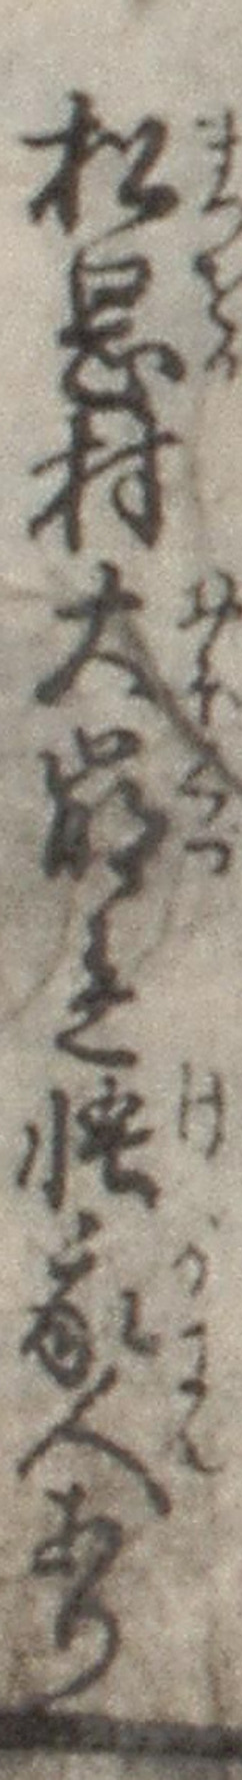松岡村大崩れ怪我人あり

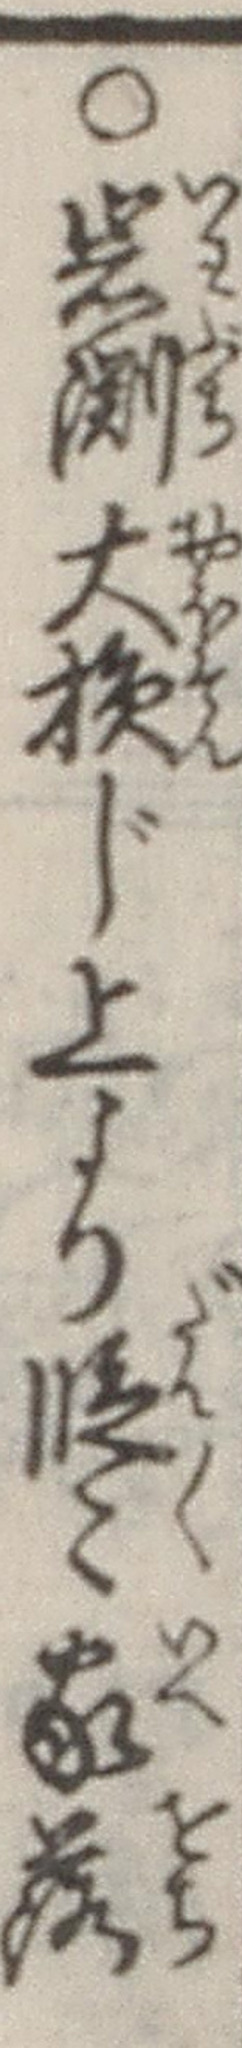○岩渕大損じ上より段々家落
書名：諸國大地震年代記　末代噺種
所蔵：東京大学地震研究所図書室 Earthquake Research Institute Library, The University of Tokyo, JAPAN
